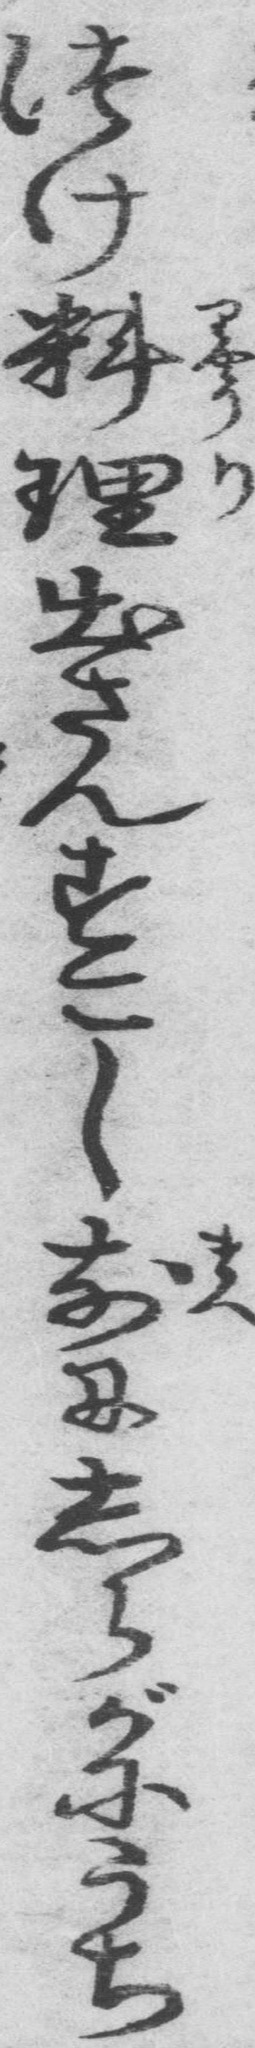徒け料理出さん春こし前丹志らが尓うち
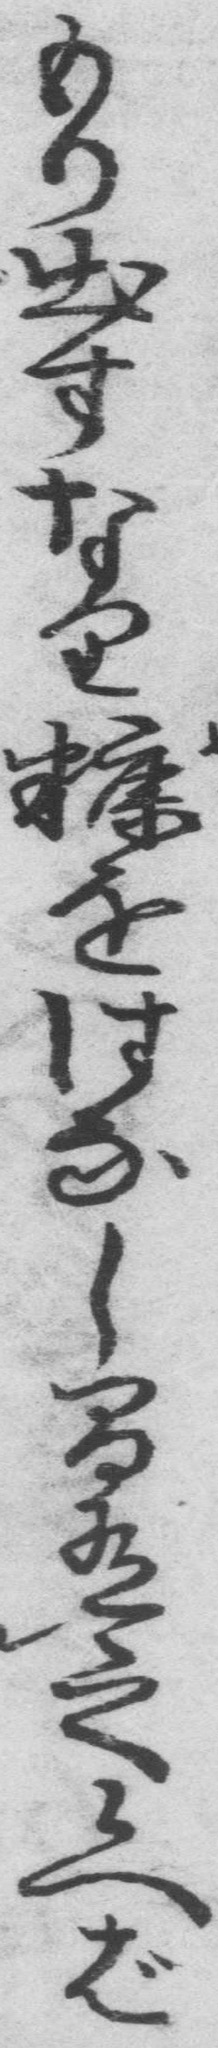もり出すな里糠をはなし間有之候へば

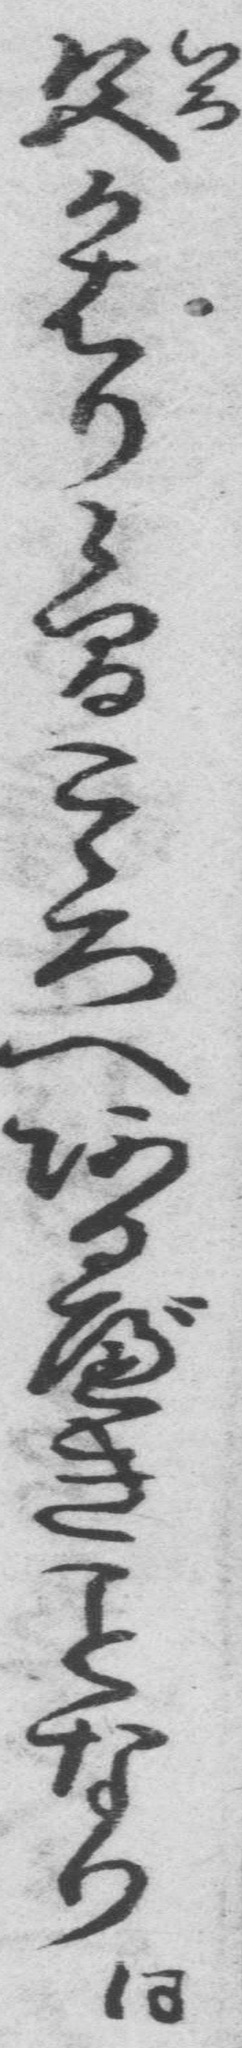色かはり之間こゝろへ阿るべきことなり同
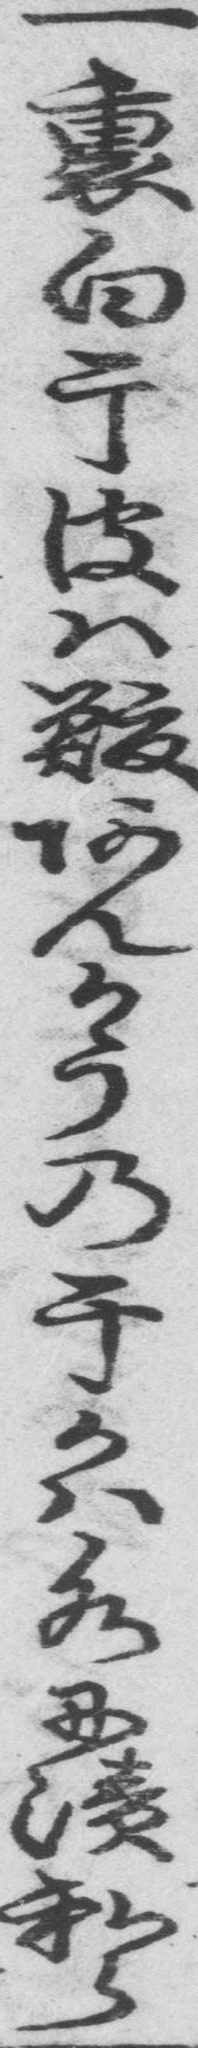一裏白干皮は鰒阿んかう乃干かは水丹漬和ら
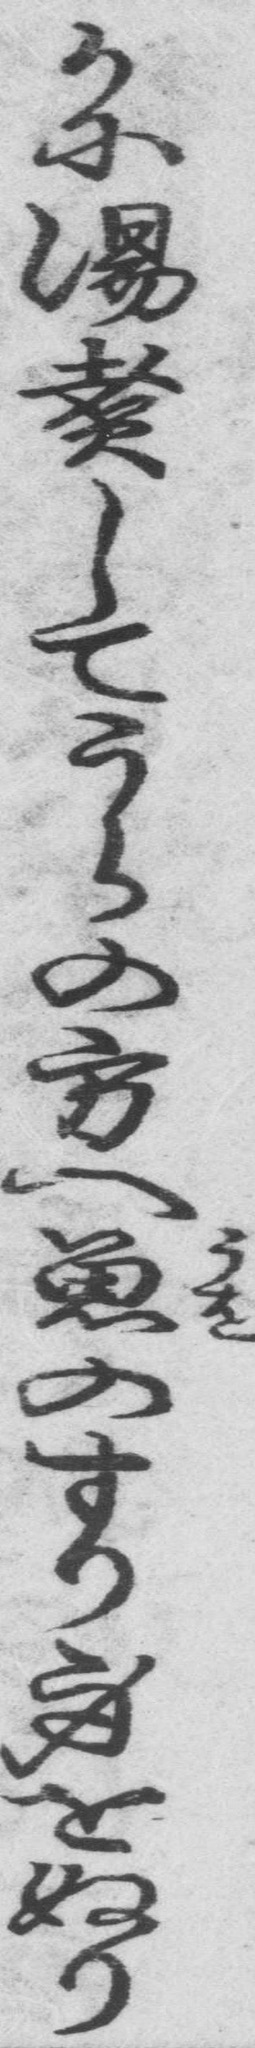か尓湯煮してうらの方へ魚のすり身をぬり
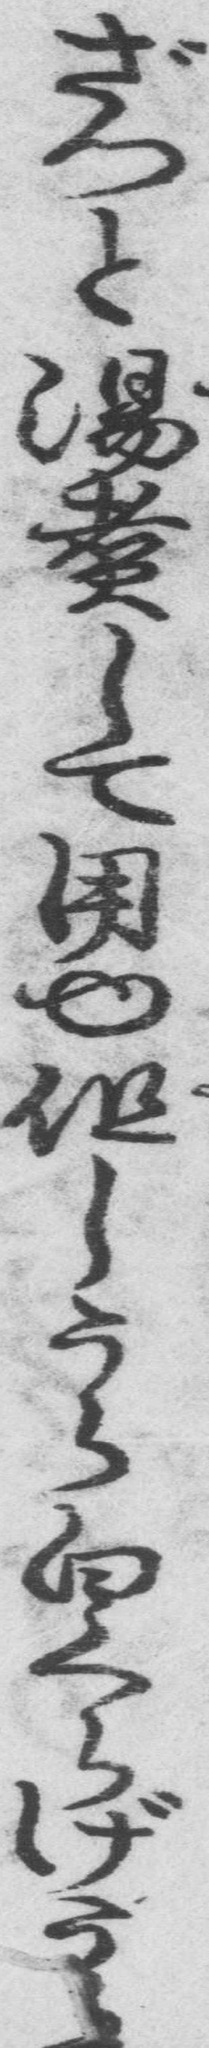ざつと湯煮して用ゆ但しうら白くらげうら
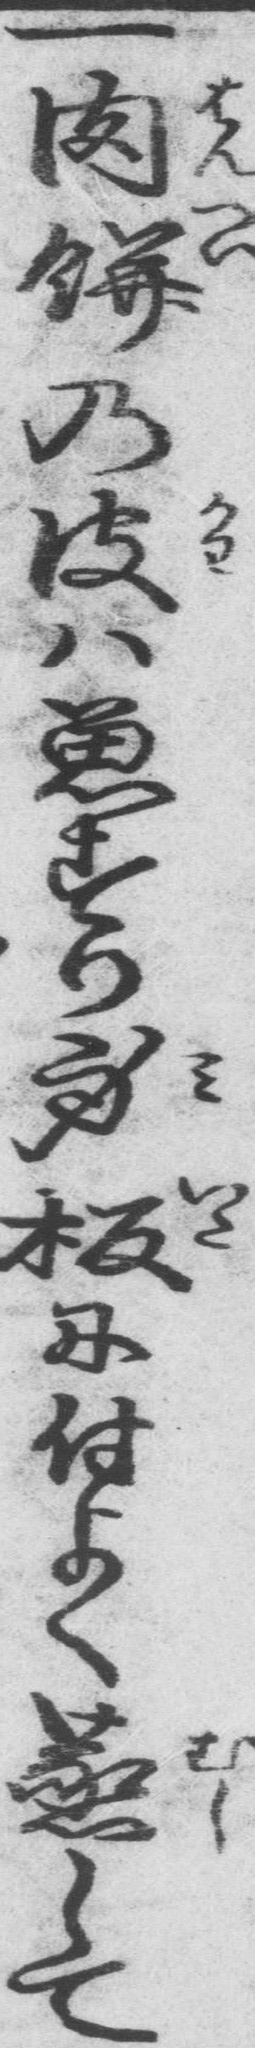一肉餅乃皮は魚春り身板丹付よく蒸して
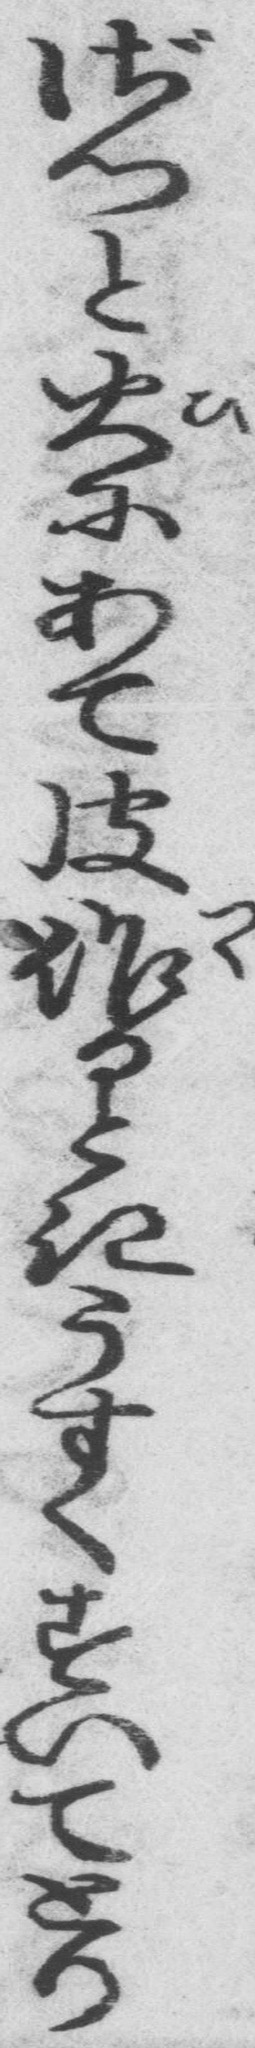ざつと火尓あて皮作ると起うすく春いてとり
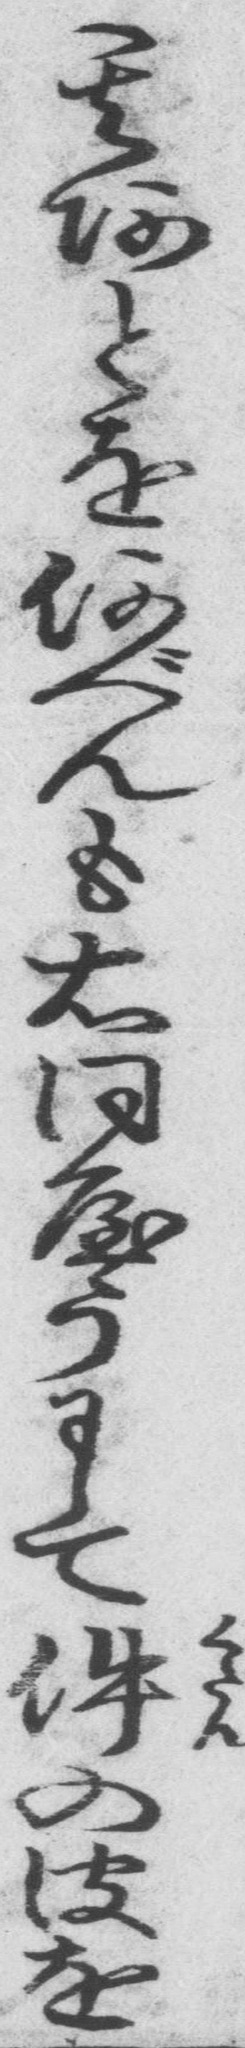其阿とを何べんも右同屋う尓て件の皮を
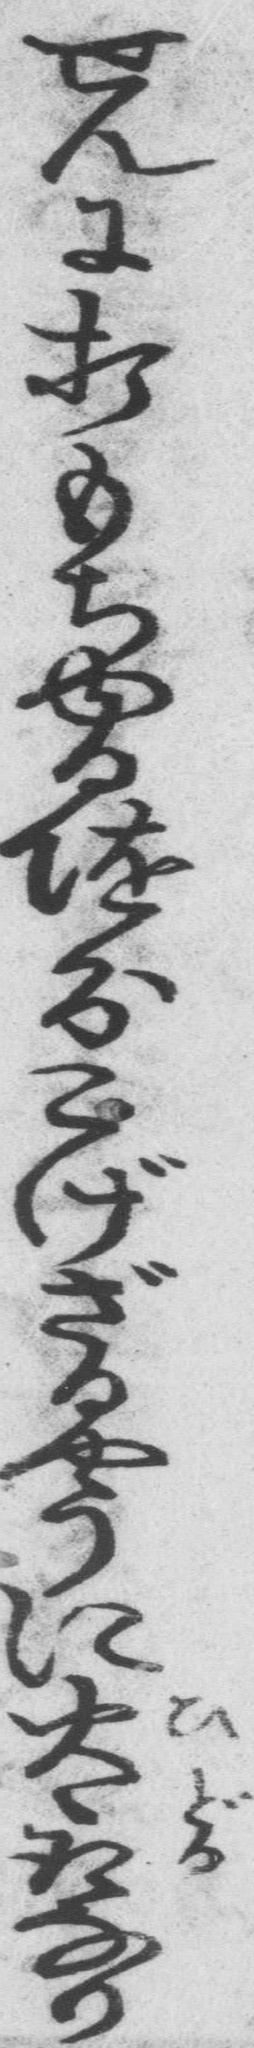せん尓打もちゆる随分こげざるやうに火取なり
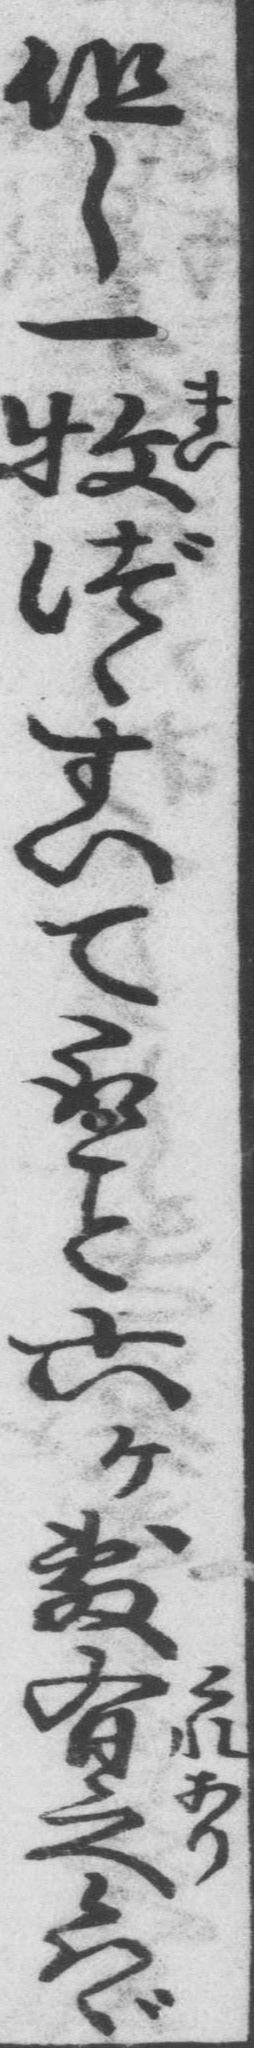但し一枚づゝすいて取こと六ヶ敷有之候はゞ
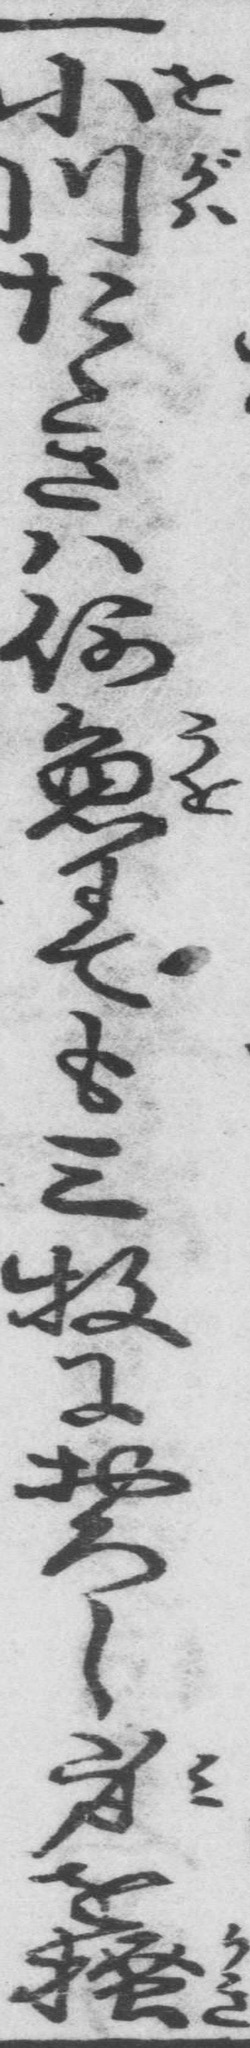一小川たゝきは何魚尓ても三枚尓おろし身を掻
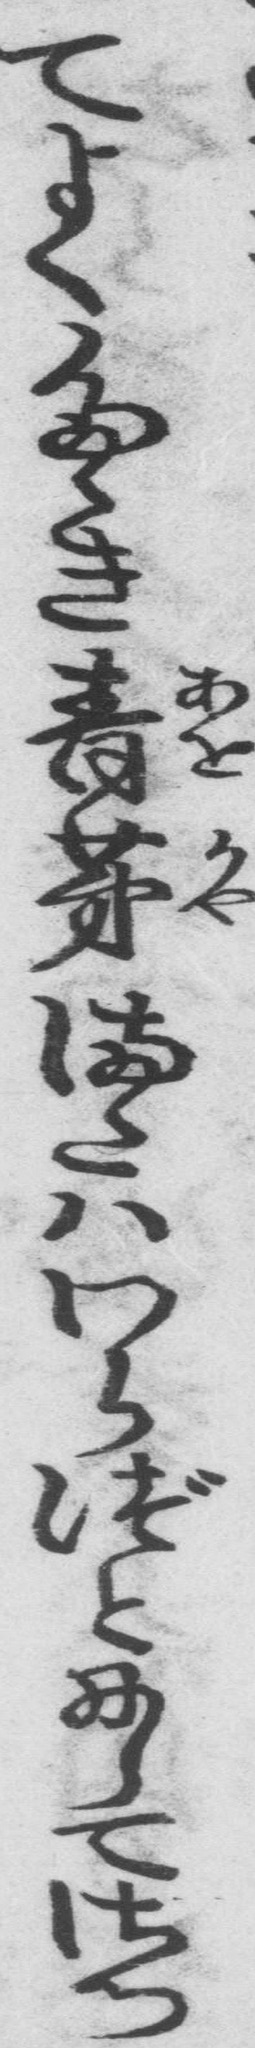てよく多き青茅満たはわらづと丹して佐つ
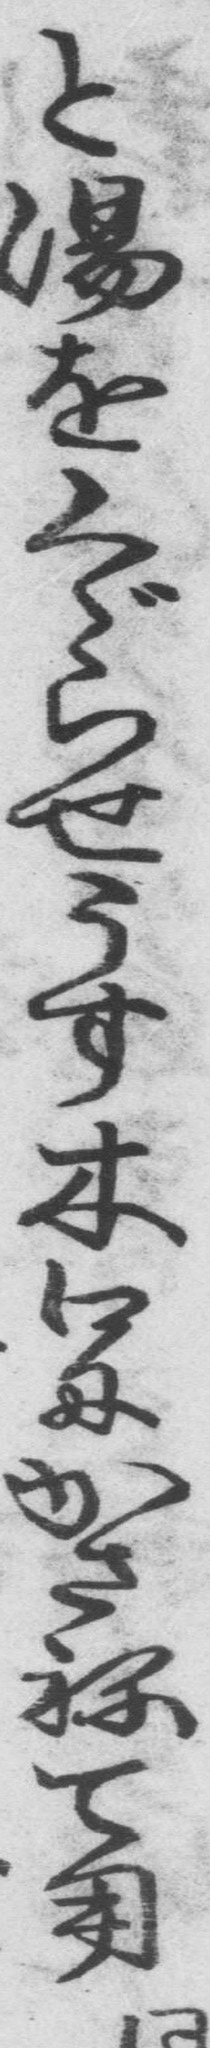と湯をくゞらせうす木口丹かさ祢て用同
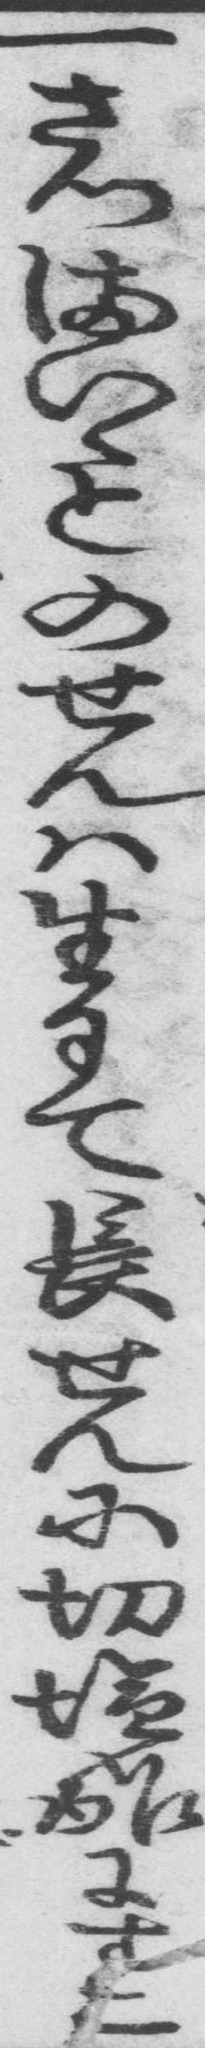一さつ満いものせんは生尓て長せん尓切塩酢尓すこ
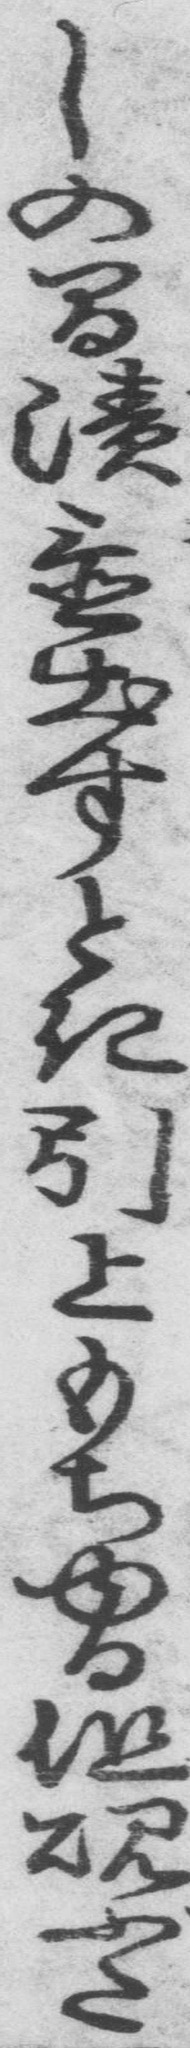しの間漬置出すと起引上もちゆる但硯ぶこ
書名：料理伊呂波庖丁
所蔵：大阪府立大学学術情報センター 国文学研究資料館
